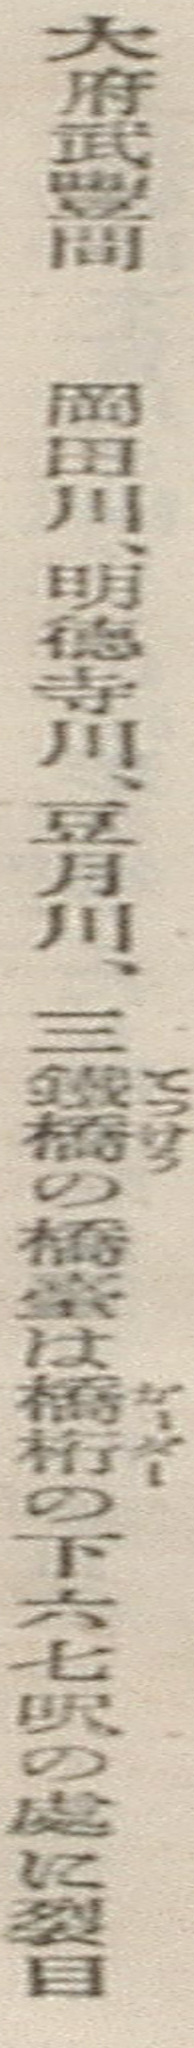大府武豊間岡田川、明徳寺川、豆月川、三鐡橋の橋臺は橋桁の下六七呎の處に裂目
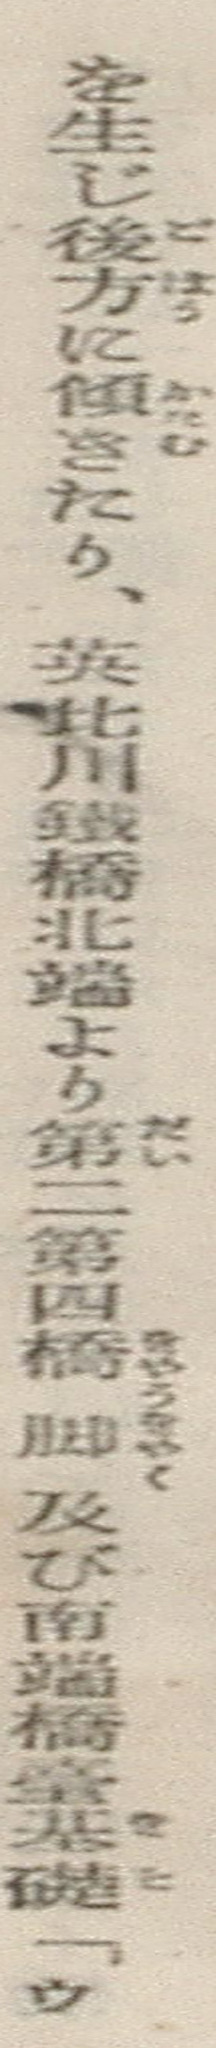を生じ後方に傾きたり、英比川鐡橋北端より第二第四橋脚及び南端橋臺基礎「ウ
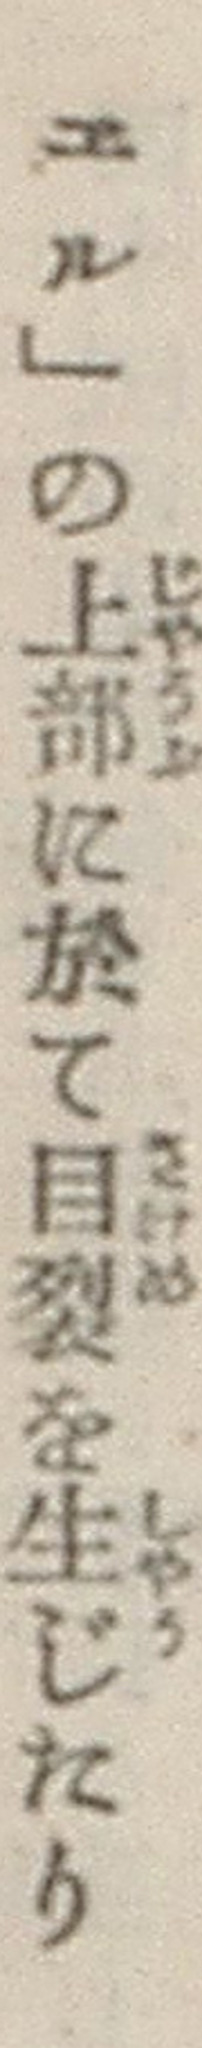エル」の上部に於て目裂を生じたり
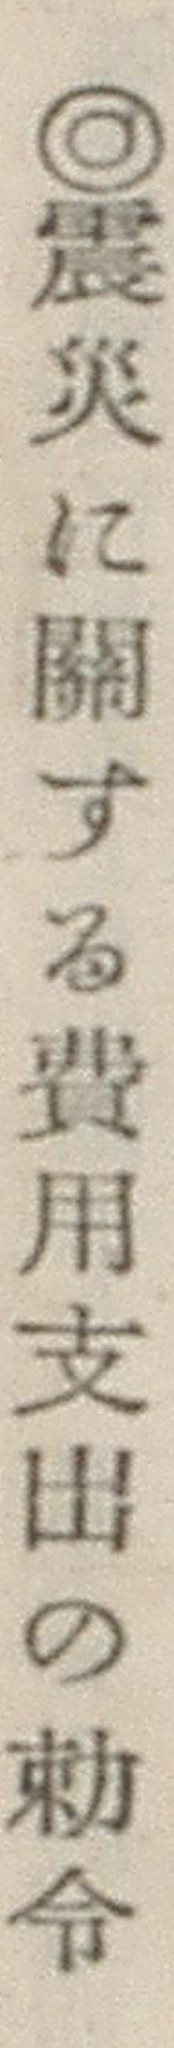◎震災に関する費用支出の勅令
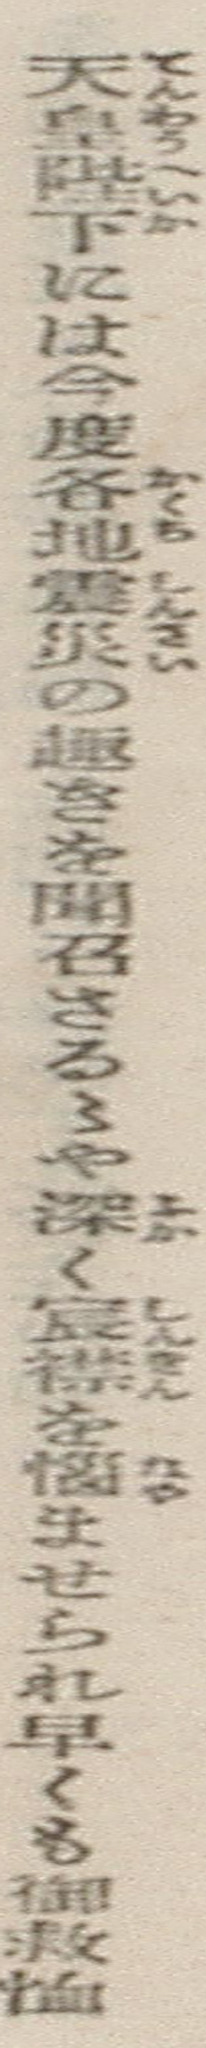天皇陛下には今度各地震災の趣きを聞召さる〻や深く宸襟を悩ませられ早くも御救恤
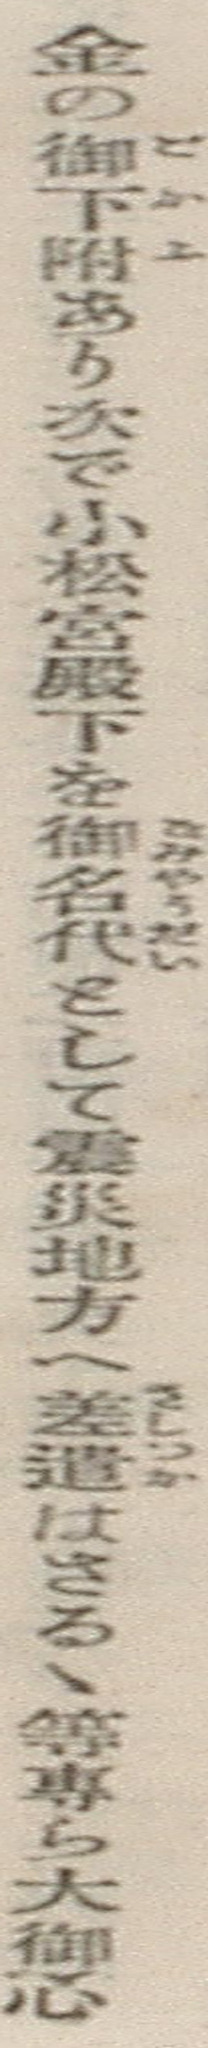金の御下附あり次で小松宮殿下を御名代として震災地方へ差遣はさるゝ等専ら大御心
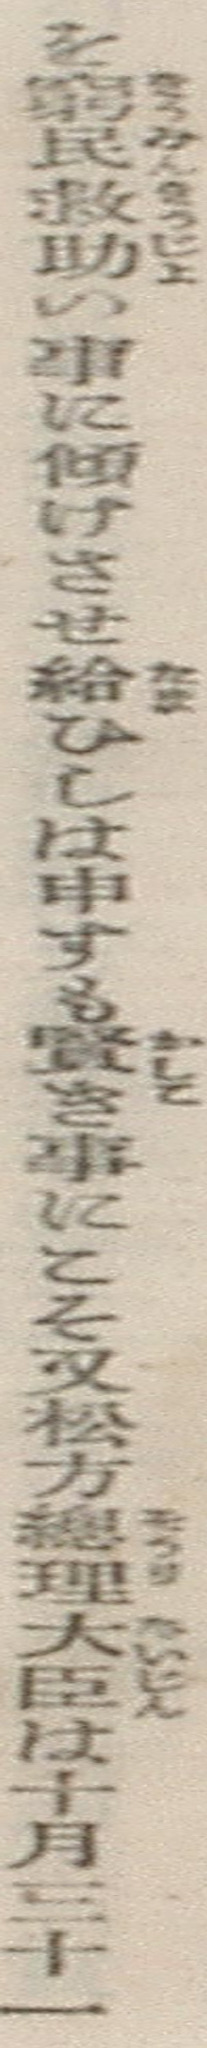を窮民救助の事に傾けさせ給ひしは申すも賢き事にこそ又松方総理大臣は十月三十一
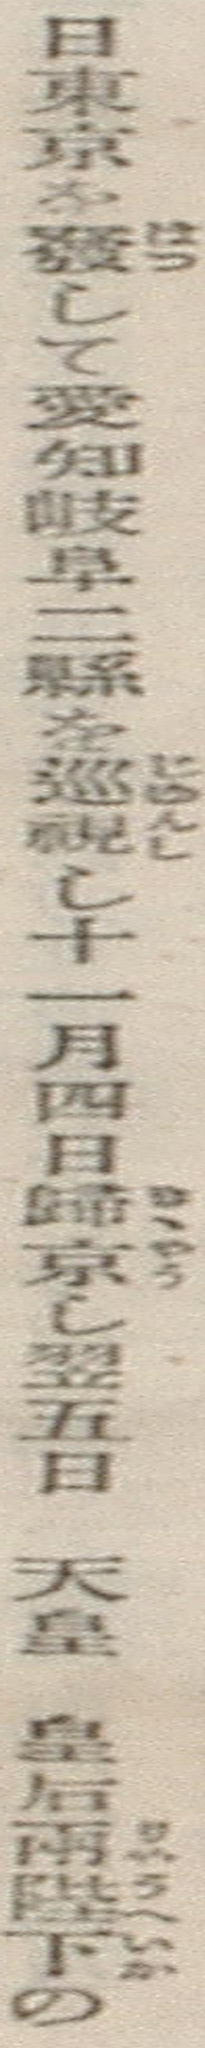日東京を発して愛知岐阜二縣を巡視し十一月四日帰京し翌五日天皇皇后兩陛下の
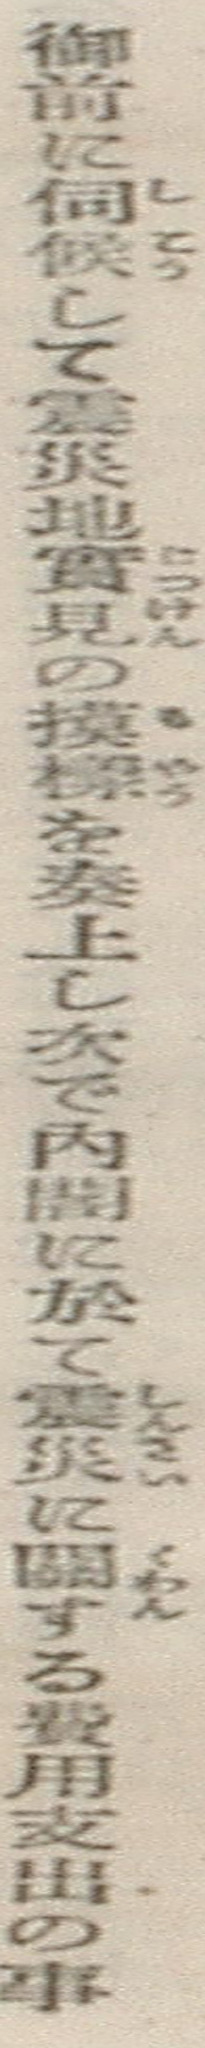御前に伺候して震災地實見の模様を奏上し次で内閣に於て震災に関する費用支出の事
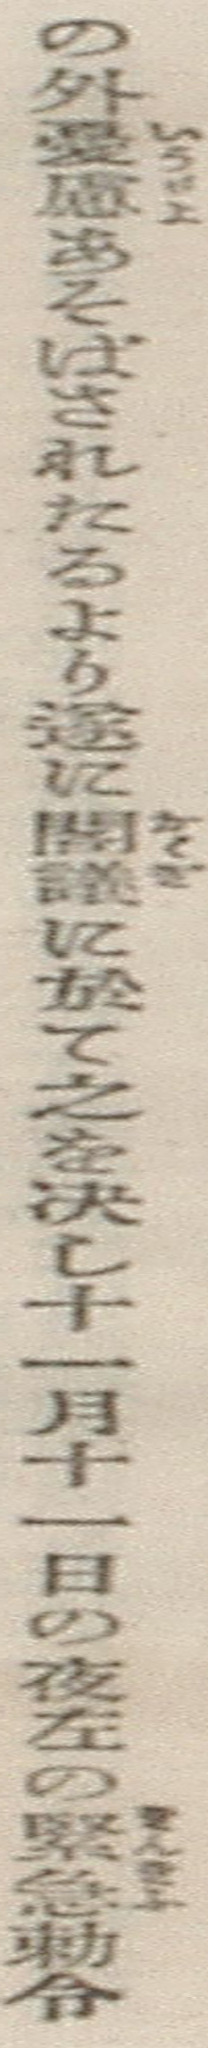の外憂慮あそばされたるにより遂に閣議に於て之を決し次し十一月十一日の夜左の緊急勅令
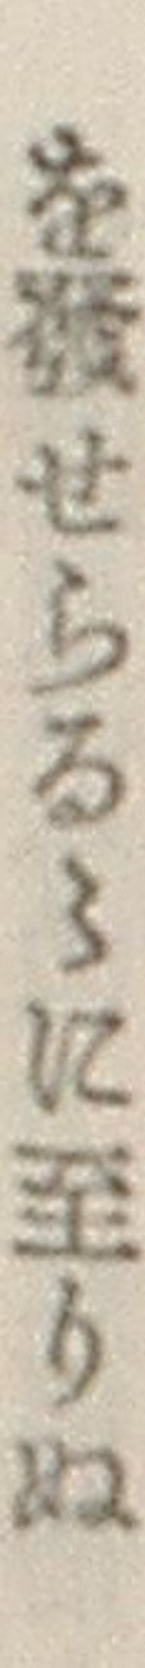を発せられる〻に至りぬ
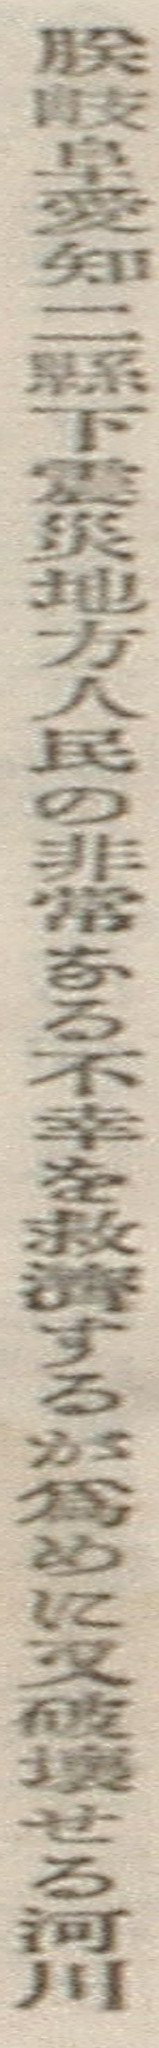眹岐阜愛知二縣下震災地方人民の非常なる不幸を救済するが為めに又破壊せる河川
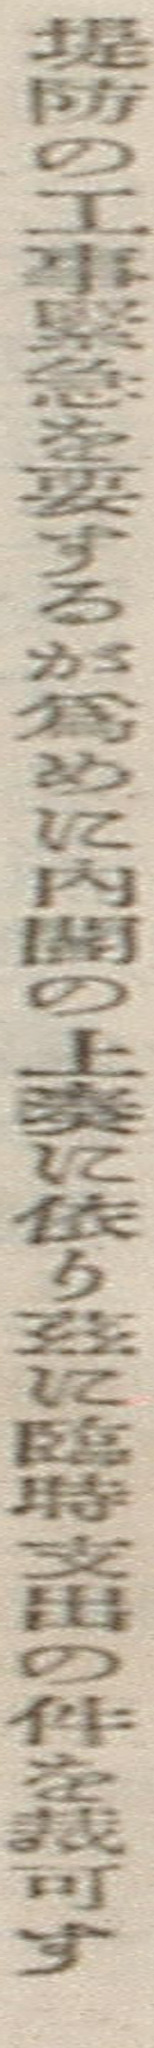堤防の工事緊急を要するが為めに内閣の上奏に依り茲に臨時支出の件を裁可す
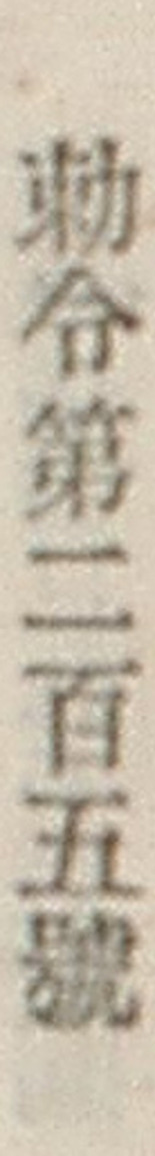勅令第二百五號

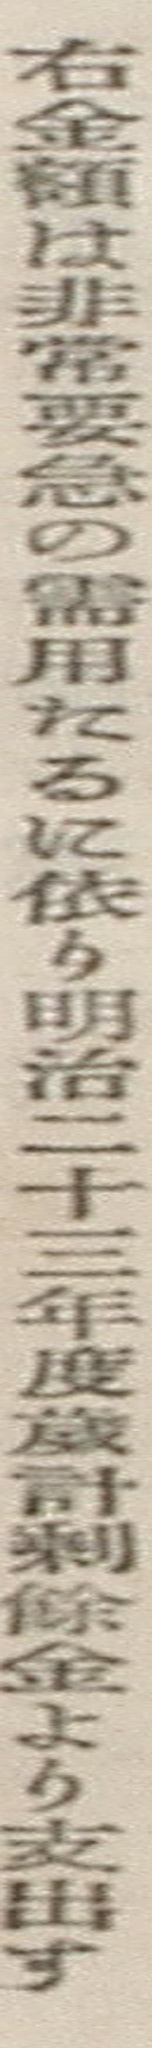右金額は非常要急の需用たるに依り明治二十三年度歳計剰餘金より支出す
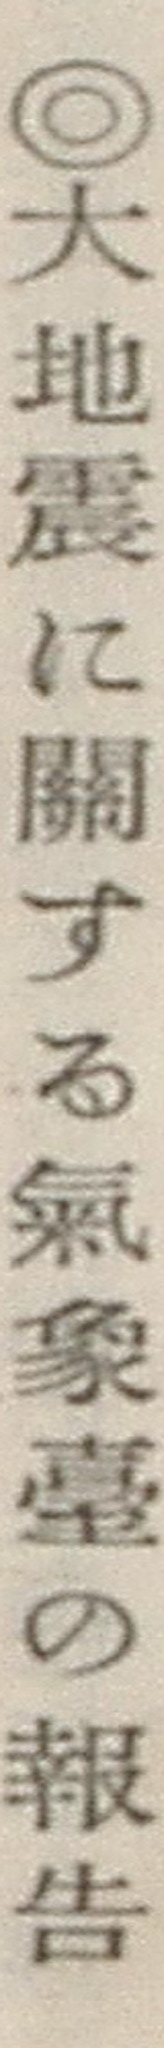◎大地震に関する気象臺の報告
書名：愛知岐阜福井三県　大地震見聞録（内題）
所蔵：東京大学地震研究所図書室 Earthquake Research Institute Library, The University of Tokyo, JAPAN
